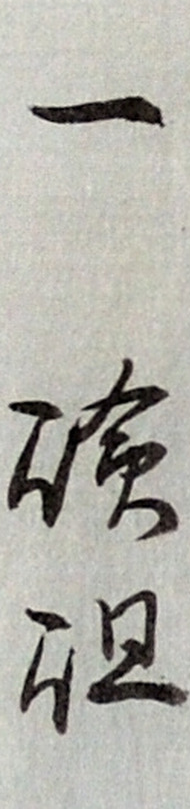一嶮岨

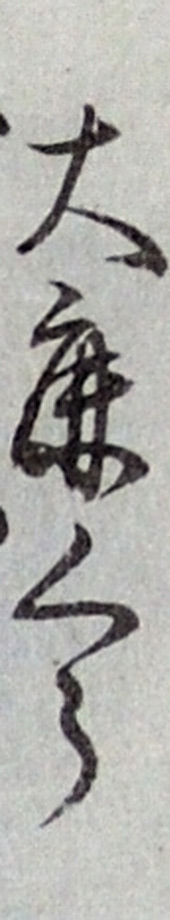大麻くら
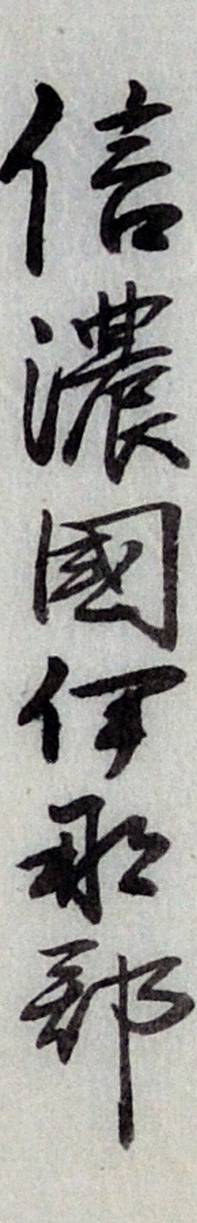信濃国伊那郡
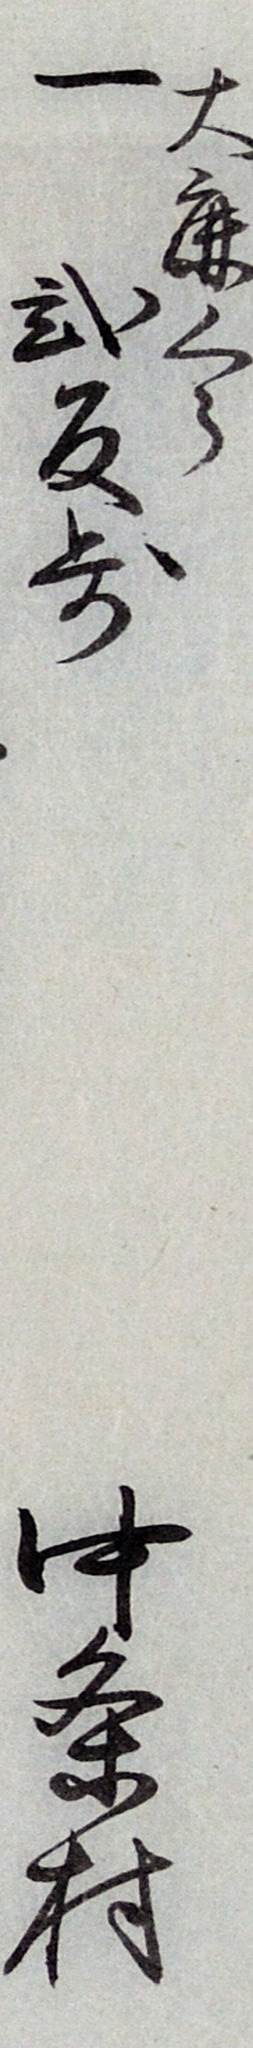一弐反歩中条村
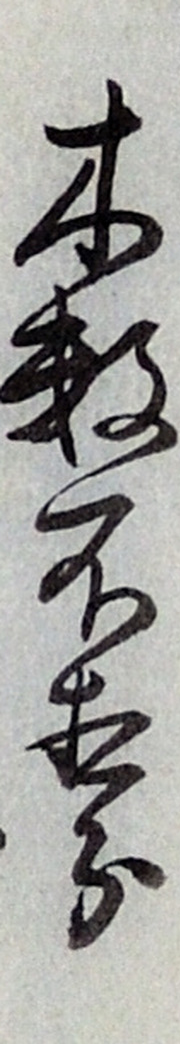木数不相分
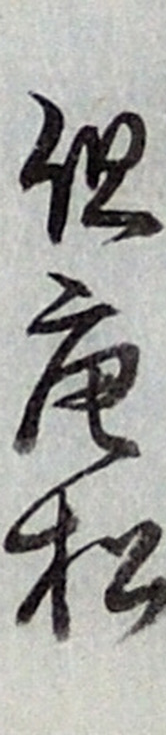但唐松
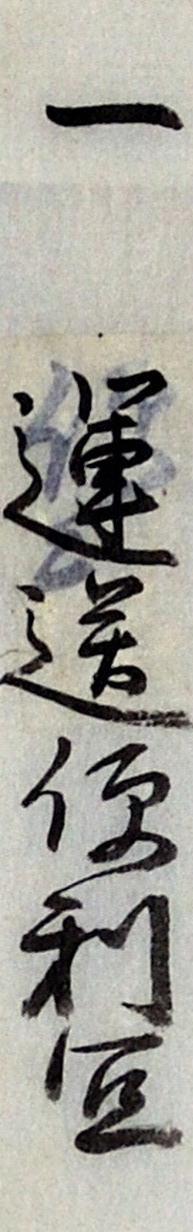一運送便利宜
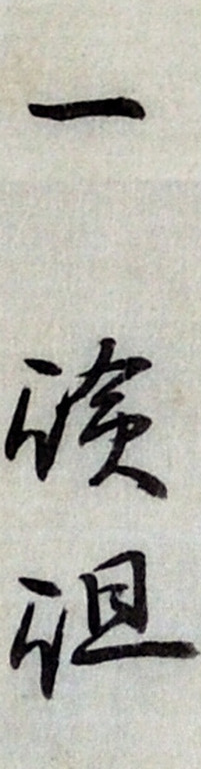一嶮岨
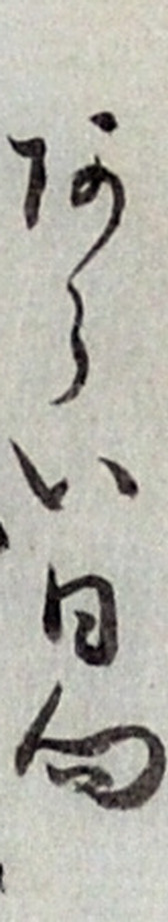阿らい日向
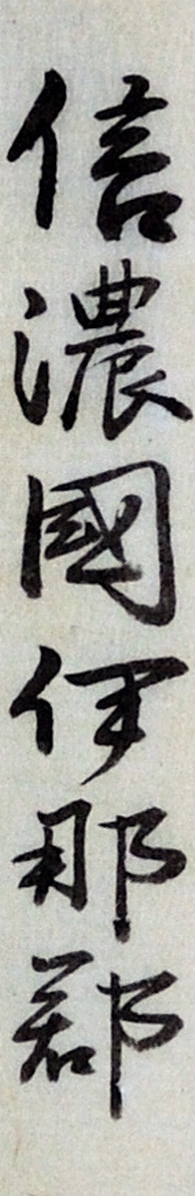信濃国伊那郡
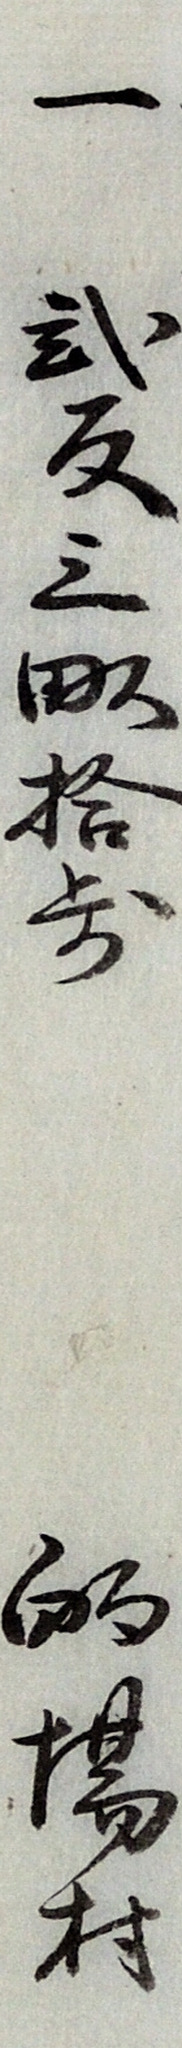一弐反三㽗拾歩的場村
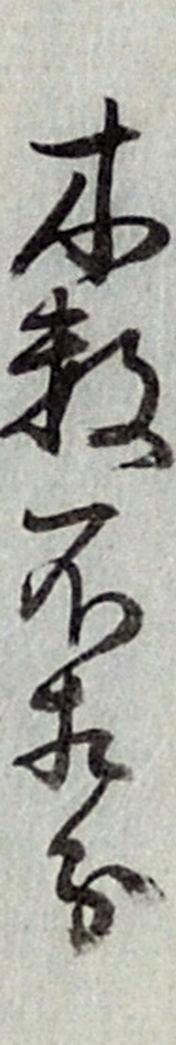木数不相分
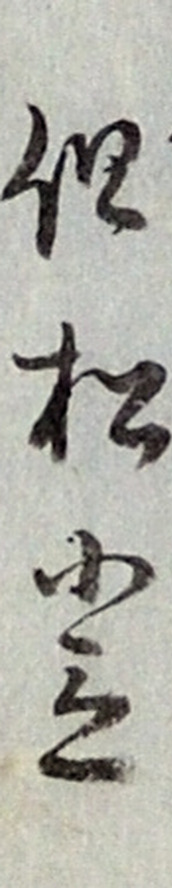但松小立
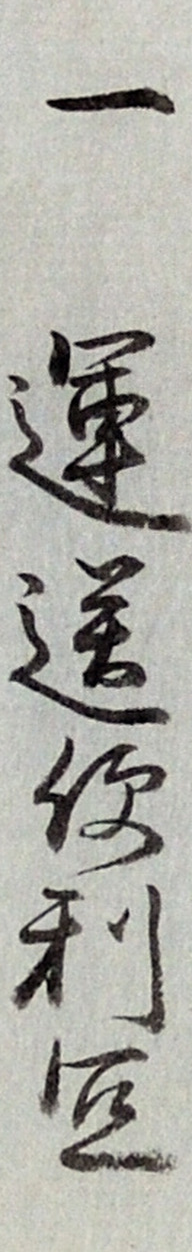一運送便利宜
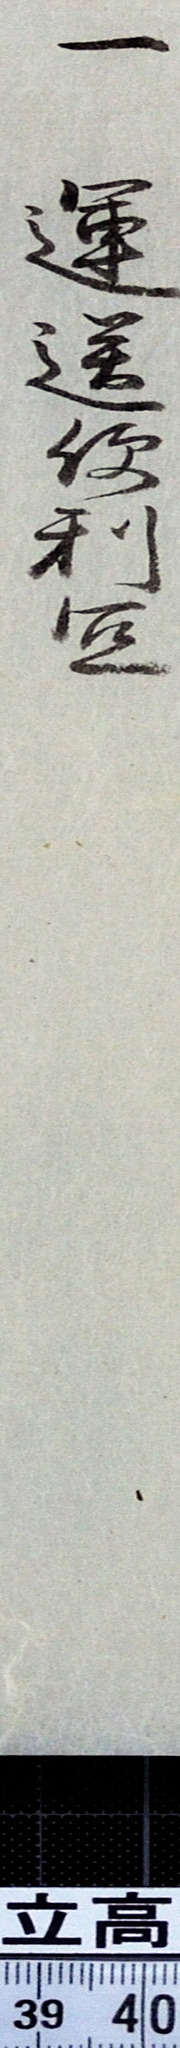一運送便利宜
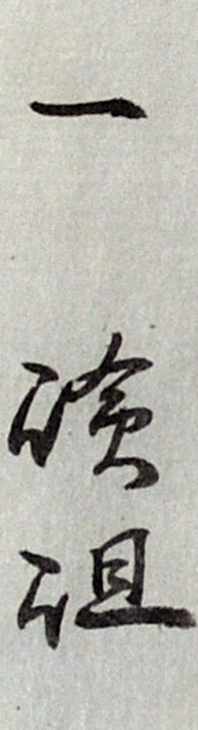一嶮岨
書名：官林反別帳
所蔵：伊那市立高遠町図書館・合同会社AMANE
